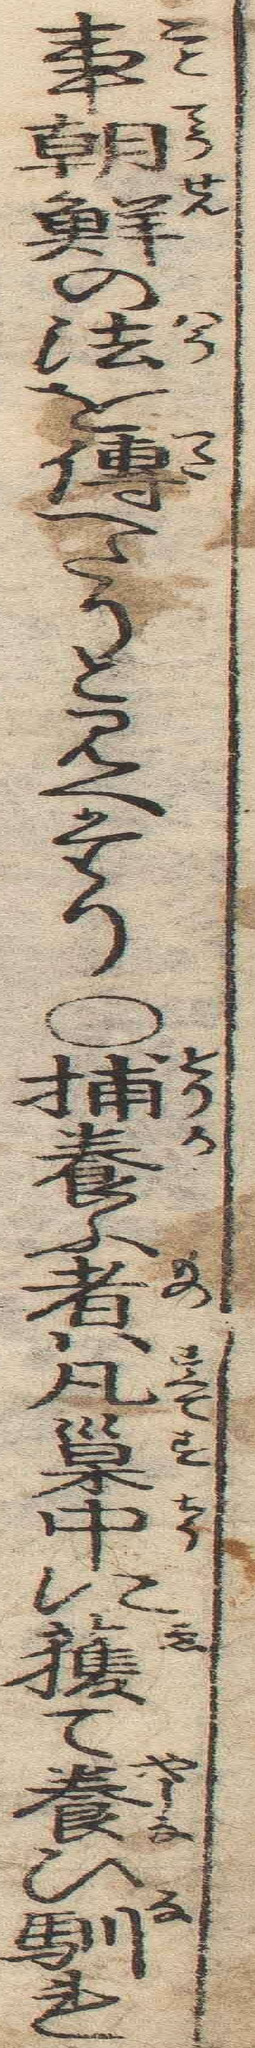事朝鮮の法を伝へたりと見へたり○捕養ふ者は凡巣中に獲て養ひ馴れ
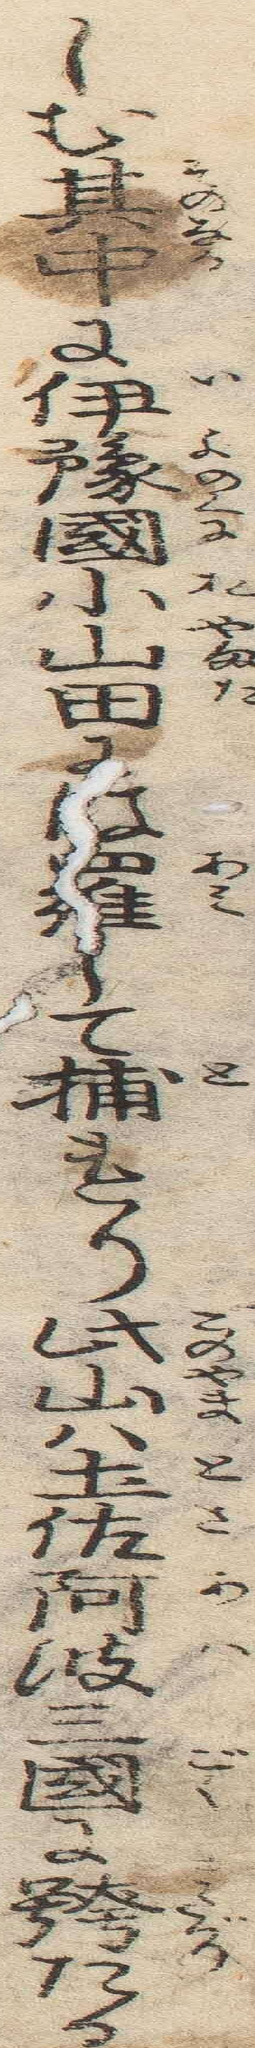しむ其中に伊予国小山田には羅して捕れり此山は土佐阿波三国に跨たる
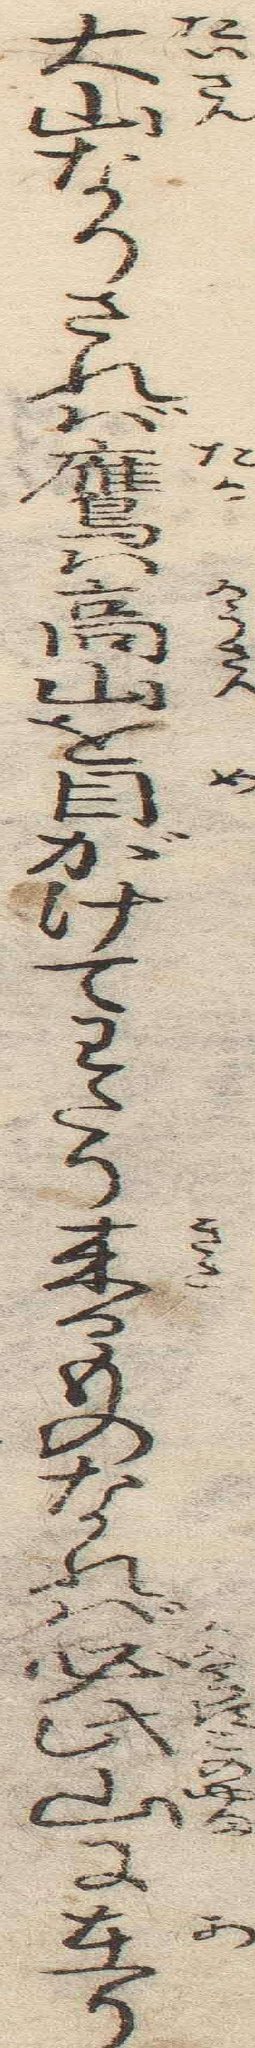大山なりされば鷹は高山を目がけてわたり来るものなれば必此山に在り
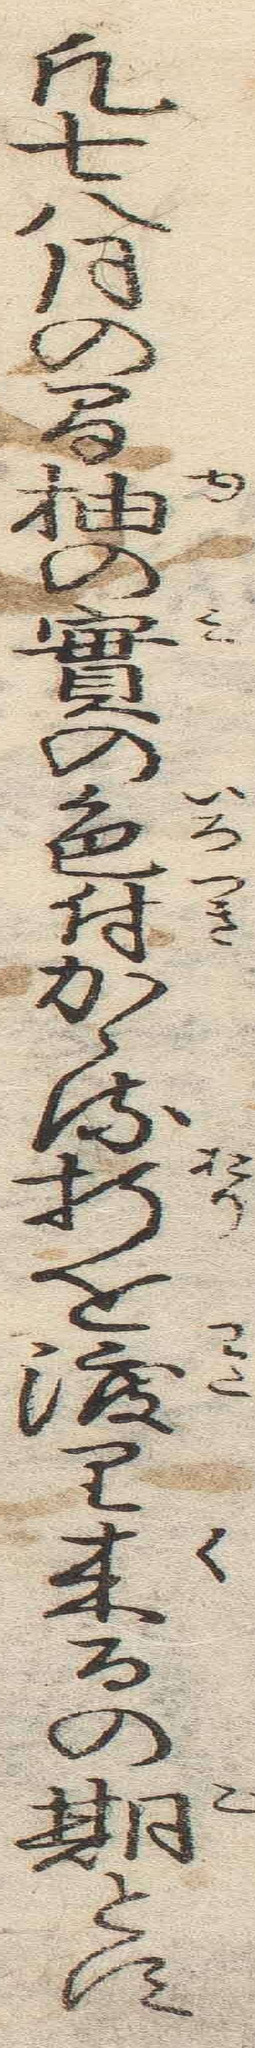凡七八月の間柚の実の色付かゝる折を渡り来るの期とす
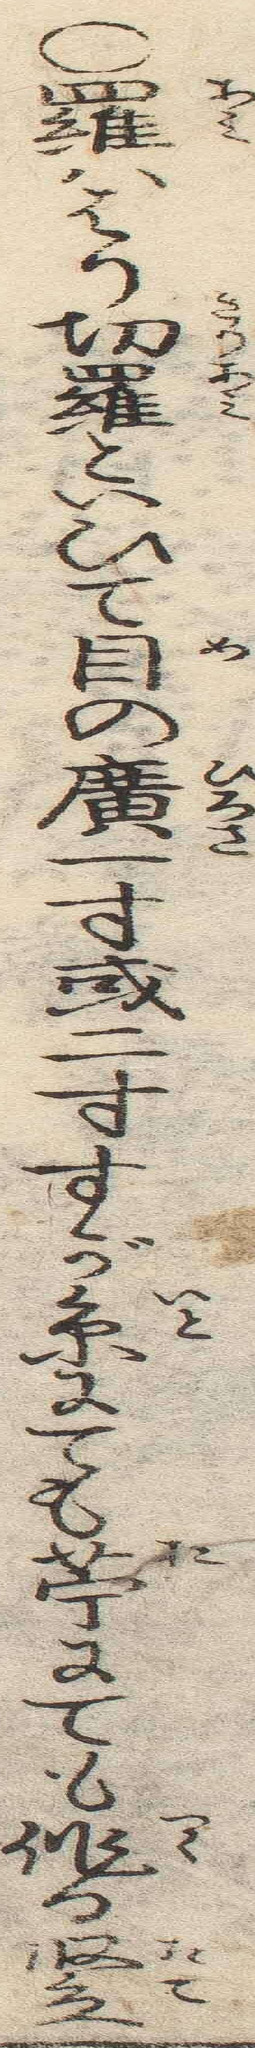○羅ははり切羅といひて目の広一寸或二寸すが糸にても苧にても作る竪
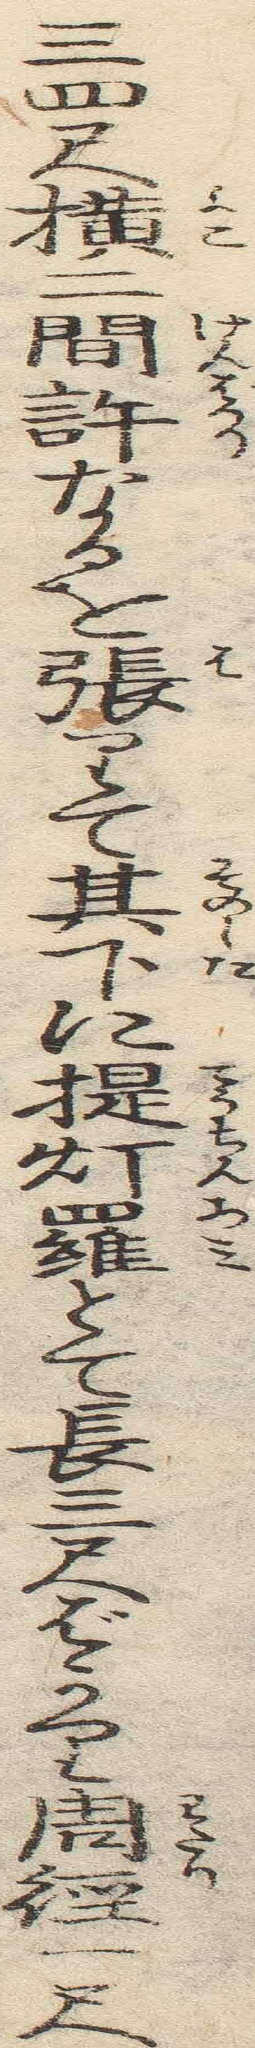三四尺横二間許なるを張りて其下に提灯羅とて長三尺ばかり周経一尺
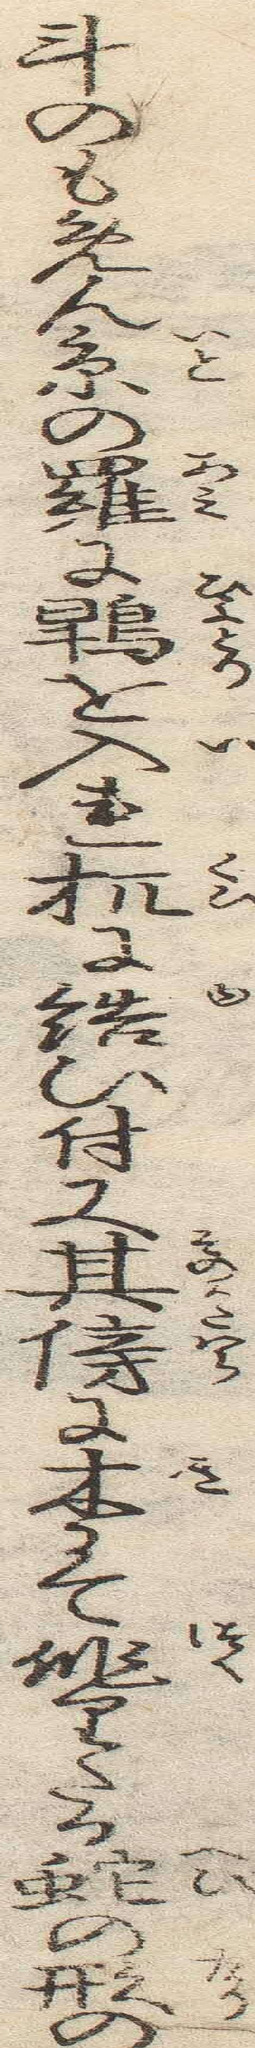斗のもめん糸の羅に鵯を入れ杭に結ひ付又其傍に木にて作りたる蛇の形の
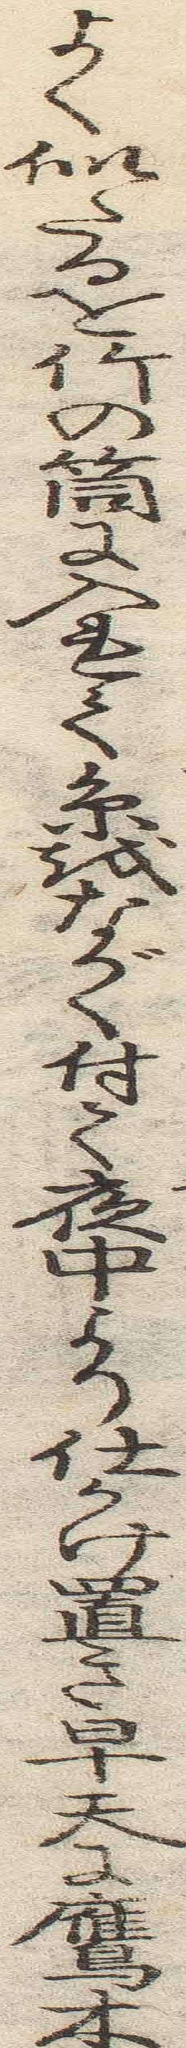よく似たるを竹の筒に入れて糸をながく付て夜中より仕かけ置き早天に鷹木
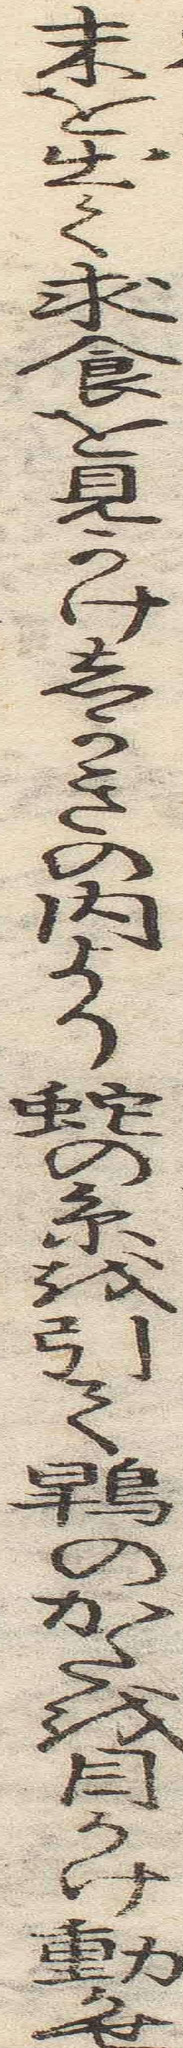末を出て求食を見かけしかきの内より蛇の糸を引て鵯のかたを目かけ動かせ
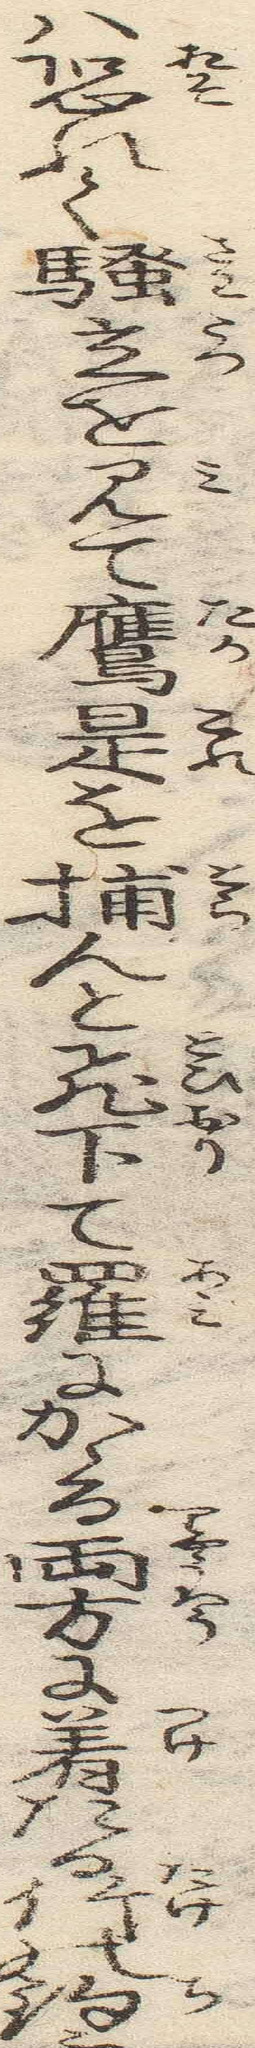は恐れて騒立を見て鷹是を捕んと飛下て羅にかゝる両方に着たる竹の釣に
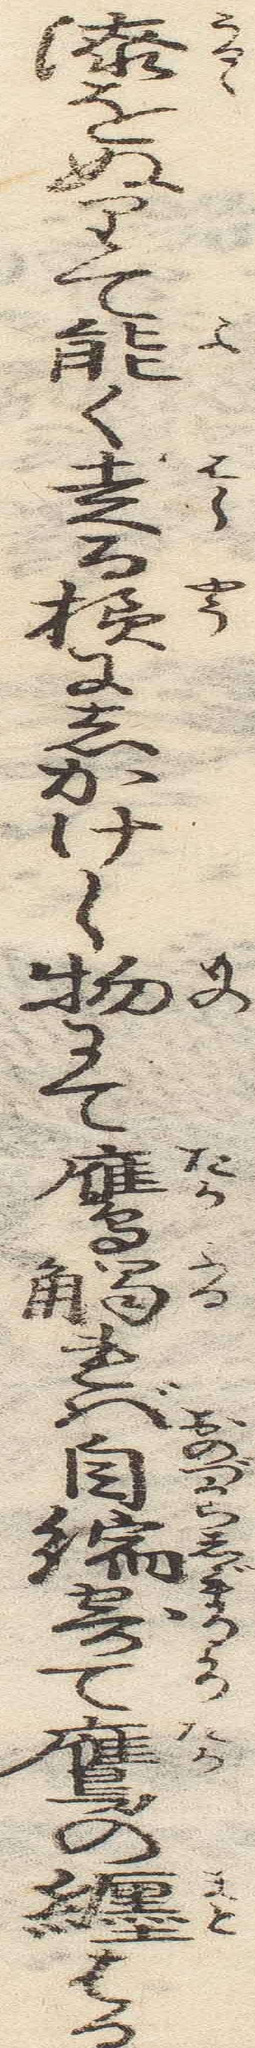漆をぬりて能く走る様にしかけし物にて鷹触れば自縮寄て鷹の纏はる
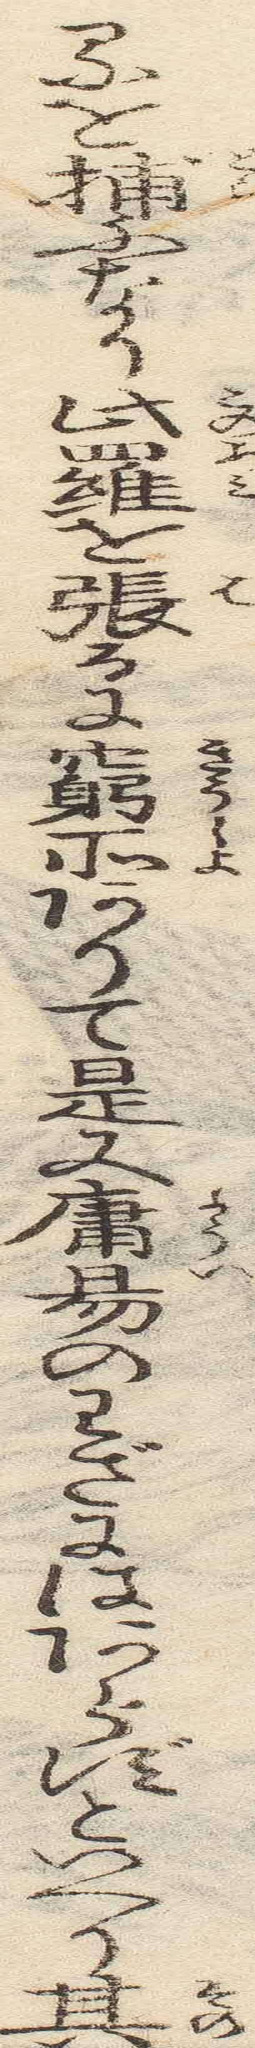るを捕ふなり此羅を張るに窮所ありて是又庸易のわざにはあらずといへり其
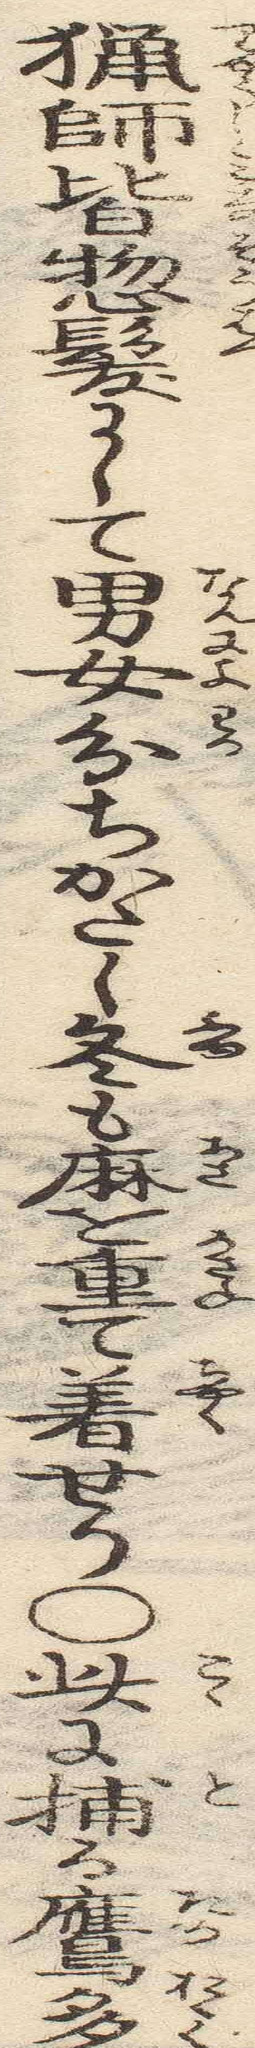猟師皆惣髪にして男女分ちかたし冬も麻を重て着せり○此に捕る鷹多
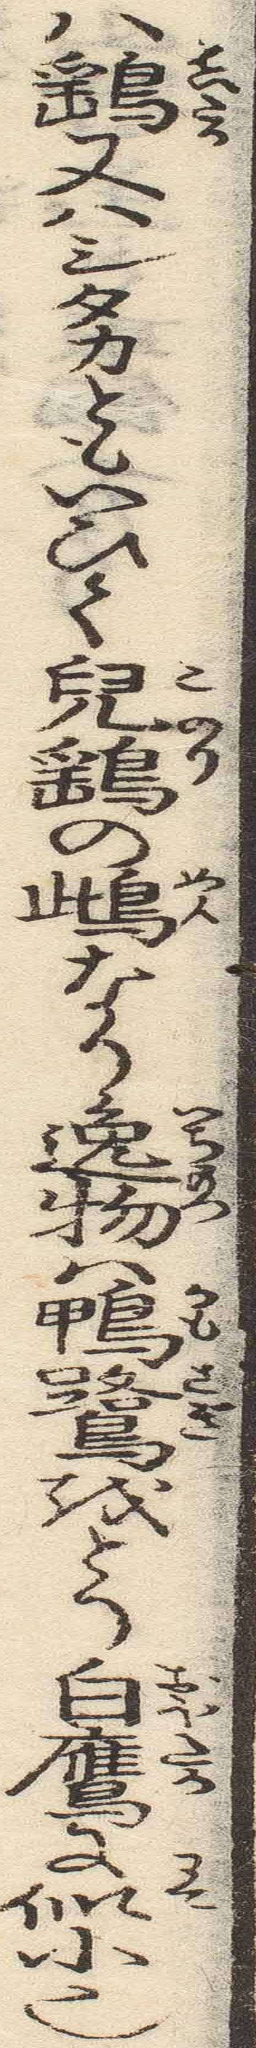は鷂又ハシタカともいひて兒鷂の雌なり逸物は鴨鷺をとり白鷹に似小也
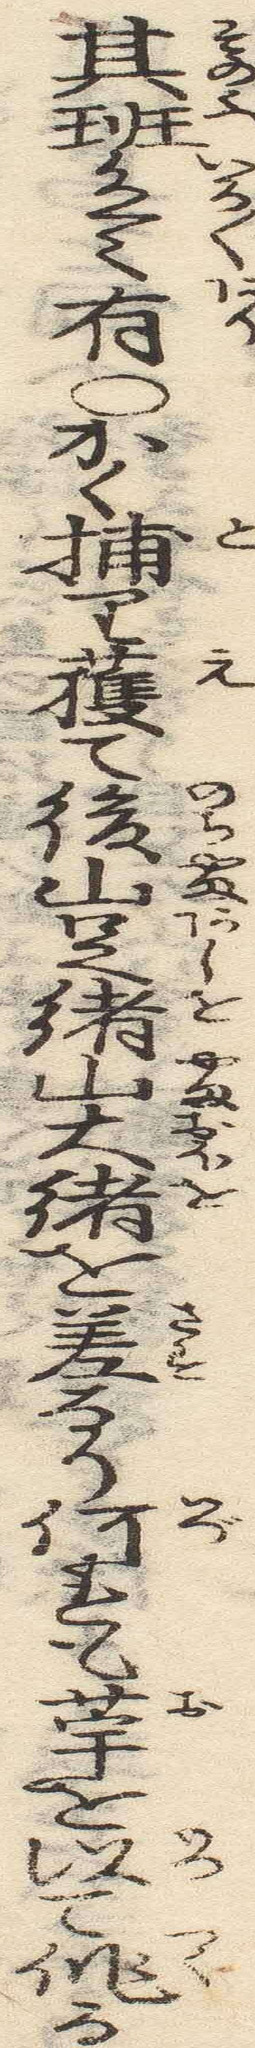其班色々有○かく捕り獲て後山足緒山大緒を差なり何れも荢を以て作る
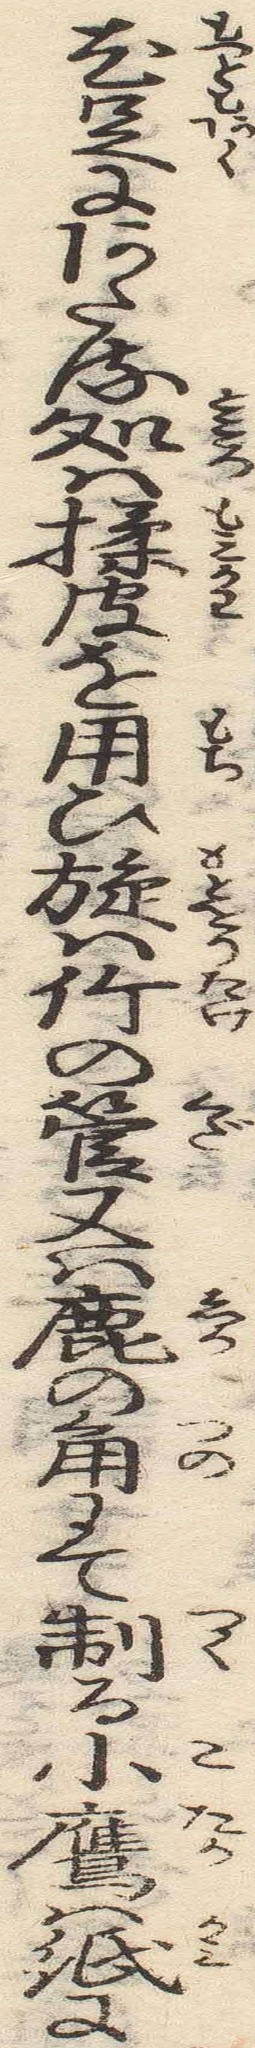尤足にあたる処は揉皮を用ひ旋は竹の管又は鹿の角にて制る小鷹は紙に
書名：日本山海名産図会
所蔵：東京学芸大学附属図書館 国文学研究資料館
